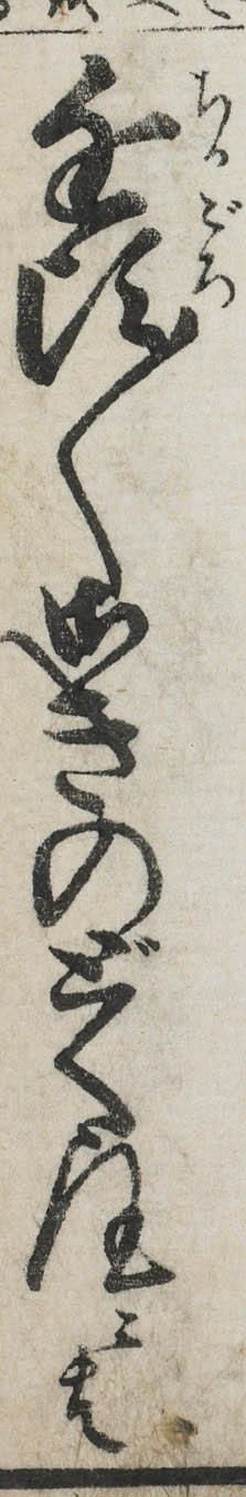近頃〳〵御きのどくさまには

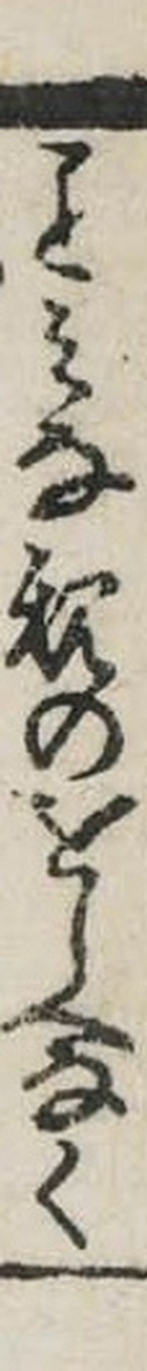ことみな親のをしへなく
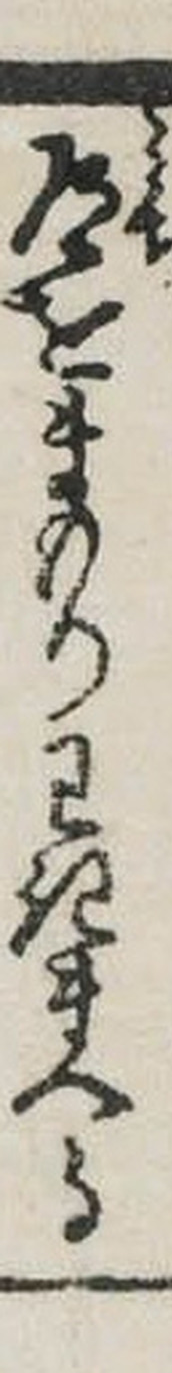道をまもりわきまへる
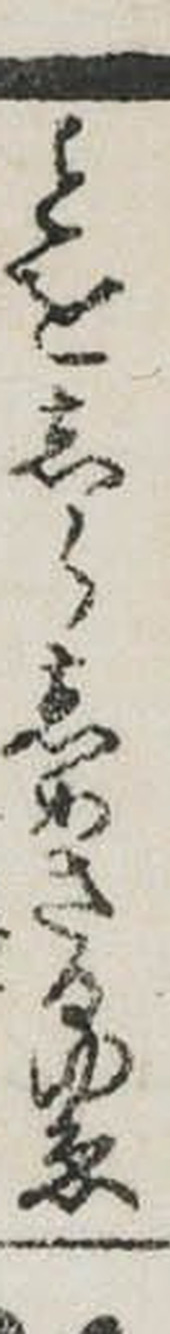ことをしらしめきるゆゑ
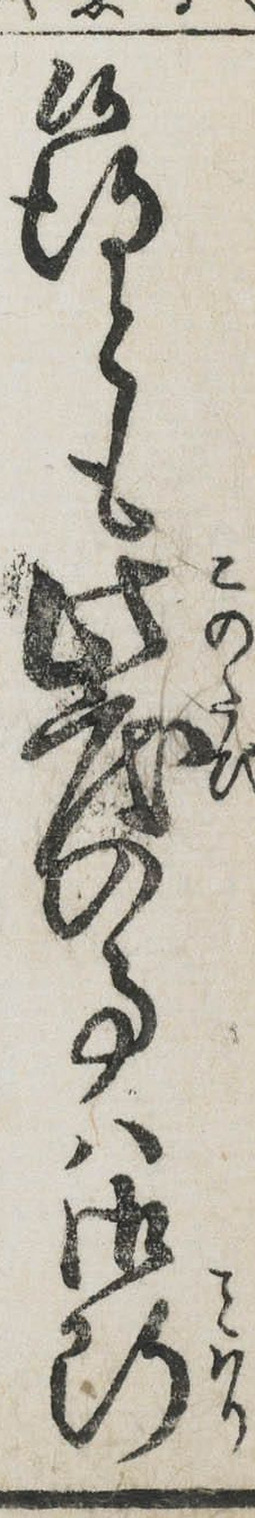候得とも此度の事は御断
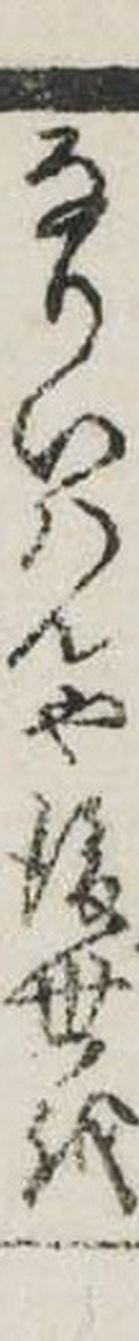なりいはんや後世を
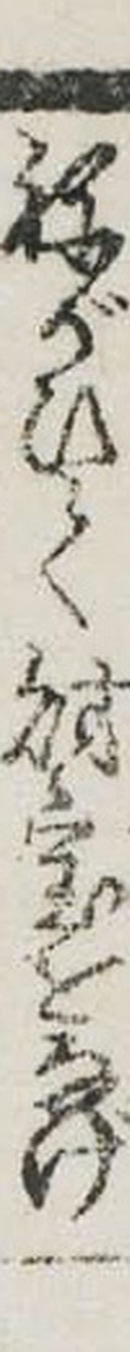もがひて財宝をなげ
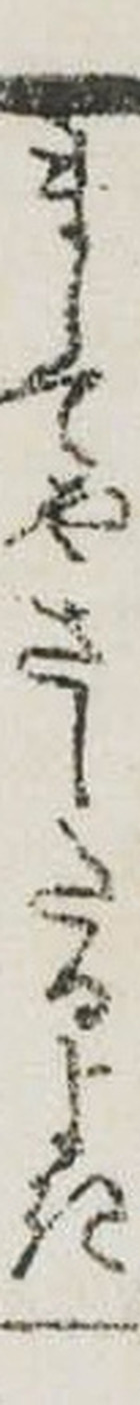ましてやさしたるよき
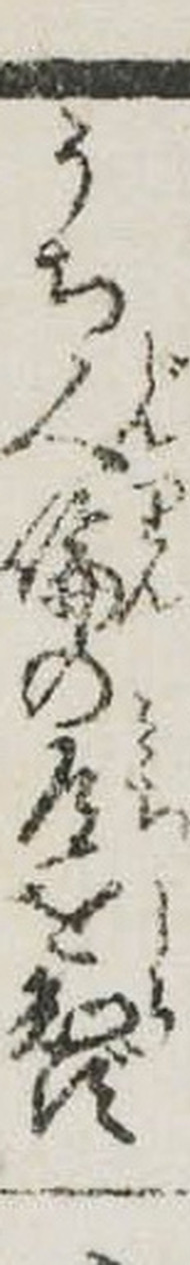うち人倫の道を知ず
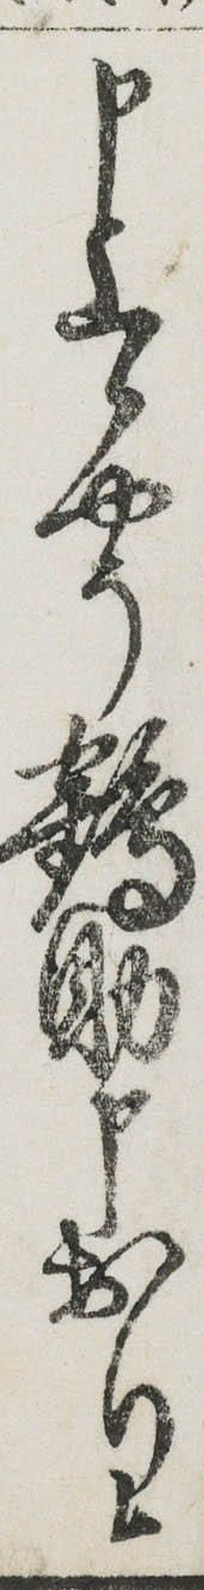申上候やう鶴助申おり候
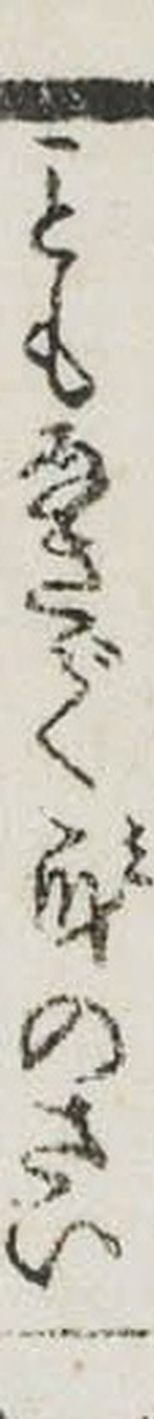こともなきで身のさい
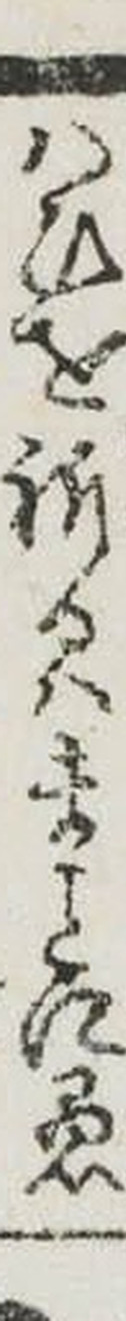はひを祈るはまことに愚
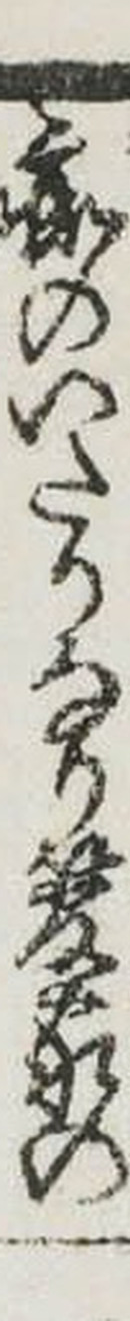痴のいたりなり菅家の
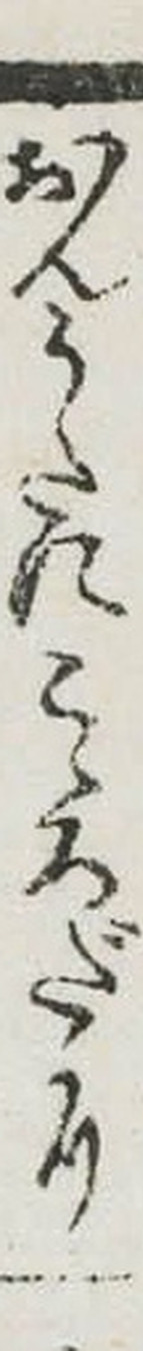おんうたにこゝろだに
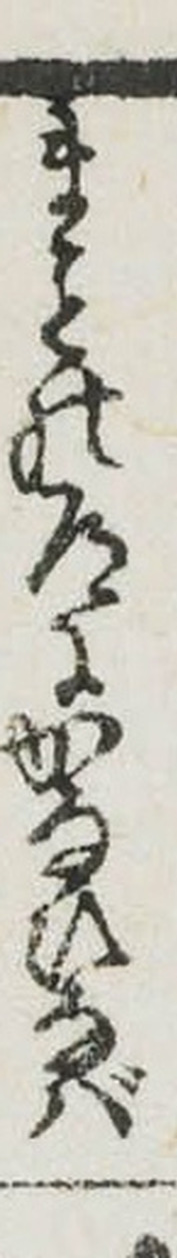まことの道にかなひなば
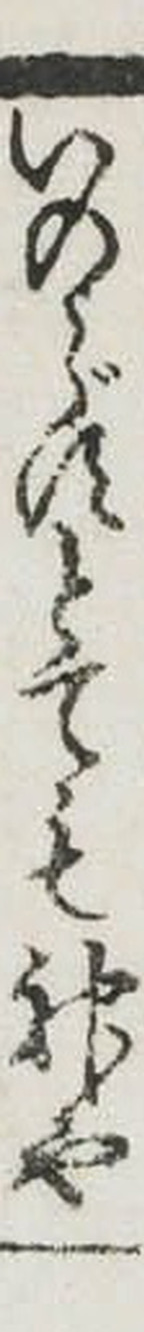いのらずとても神や
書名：頭書萬用婦人手紙之文言
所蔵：東京学芸大学教育コンテンツアーカイブ
